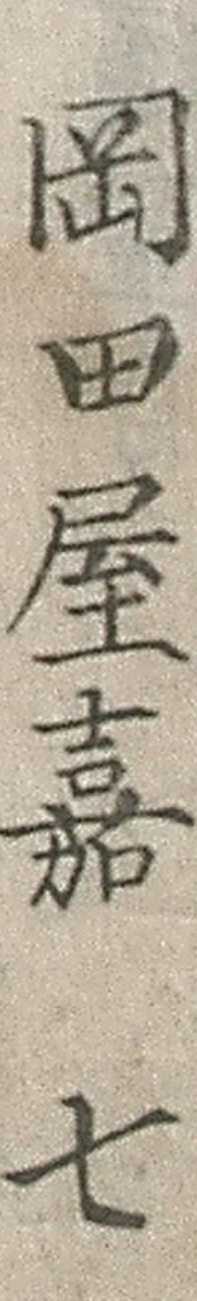岡田屋嘉七
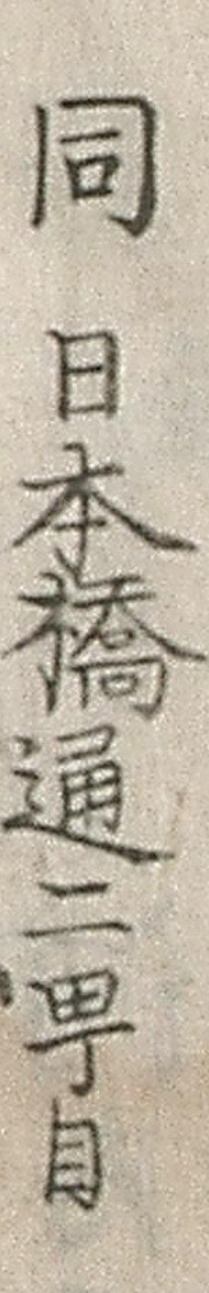書同日本橋通二町目
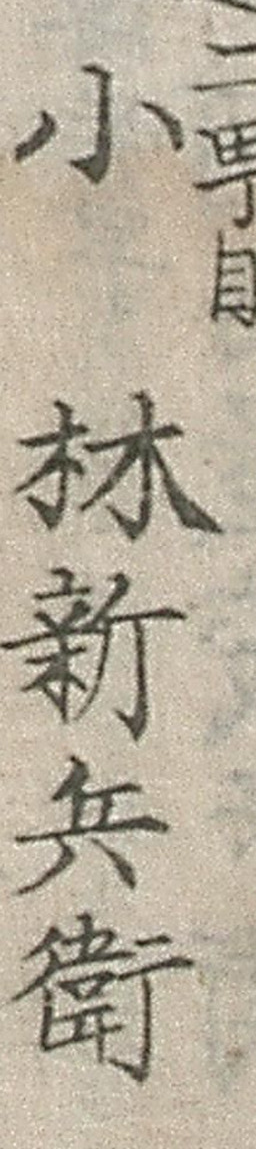小林新兵衛
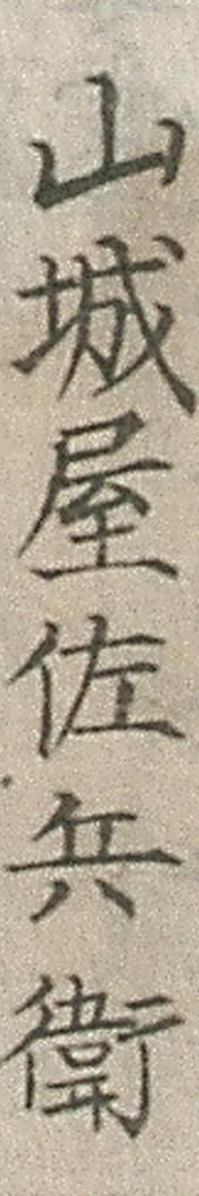山城屋佐兵衛
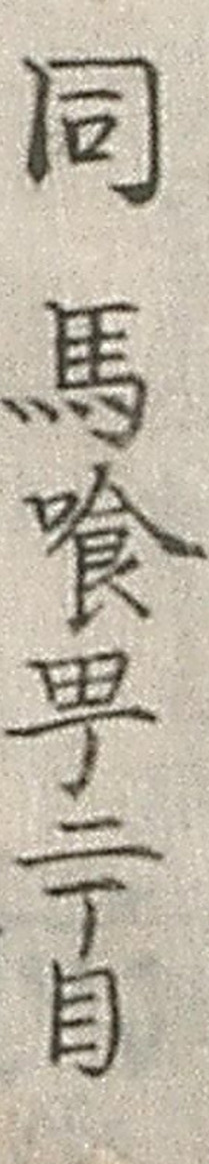肆同馬喰町二丁目
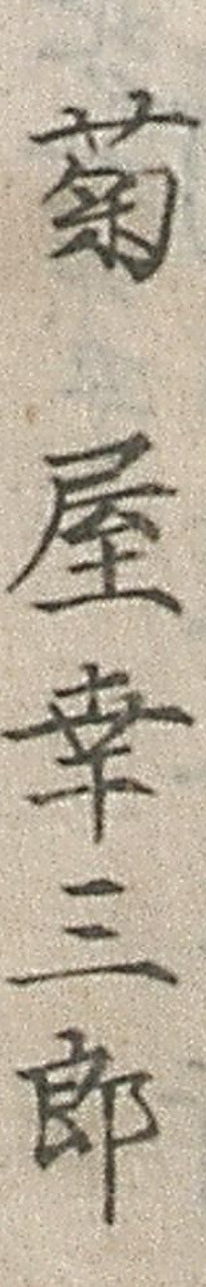菊屋幸三郎
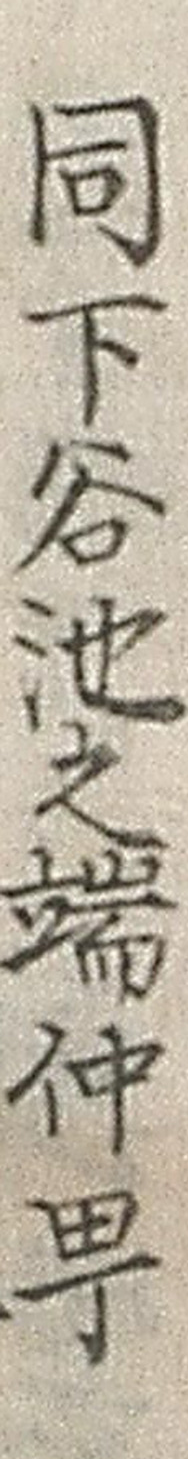同下谷池之端仲町
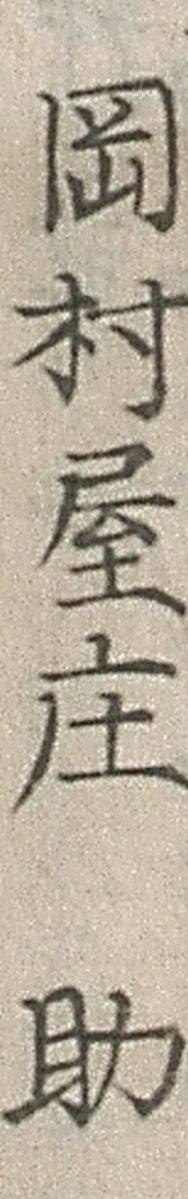岡村屋庄助
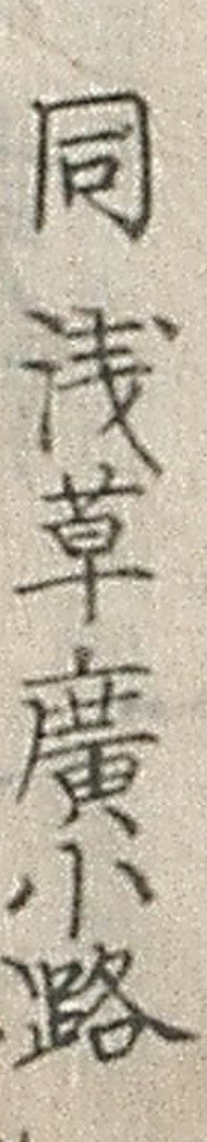同浅草廣小路
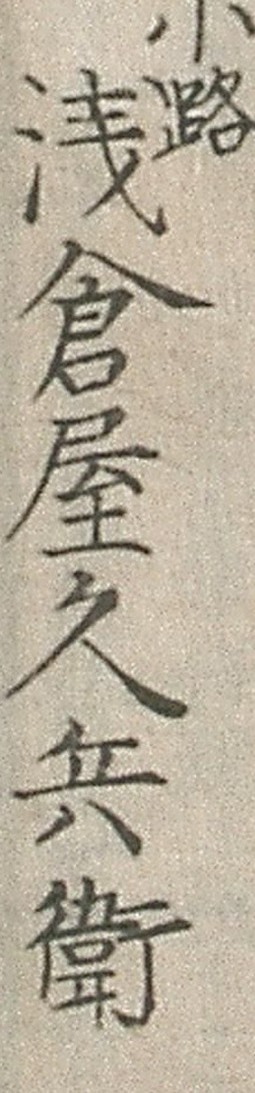朝倉屋久兵衛
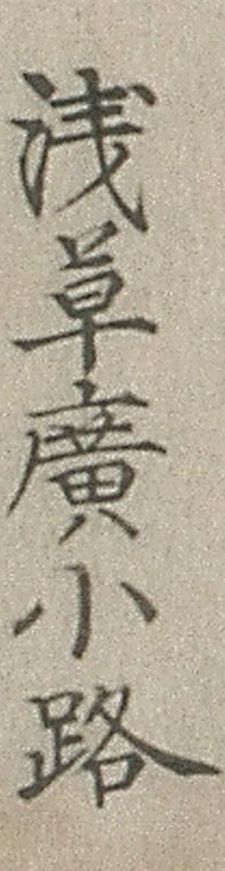浅草廣小路
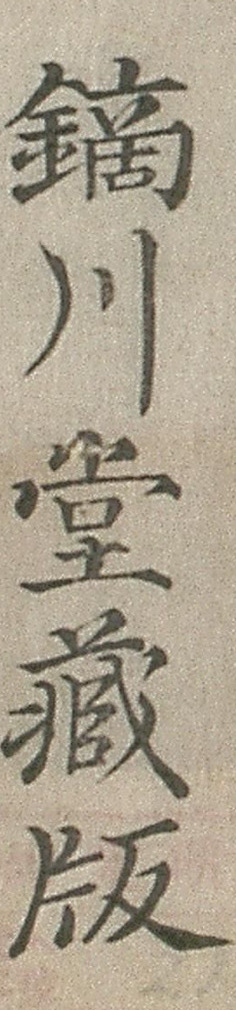鏑川堂蔵版
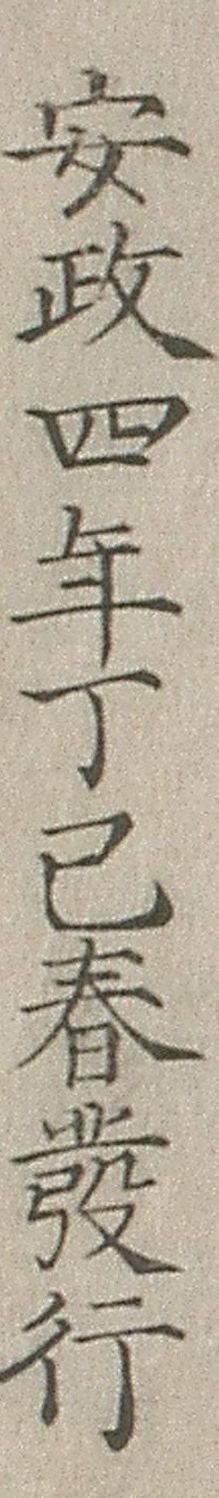安政四年丁巳春発行
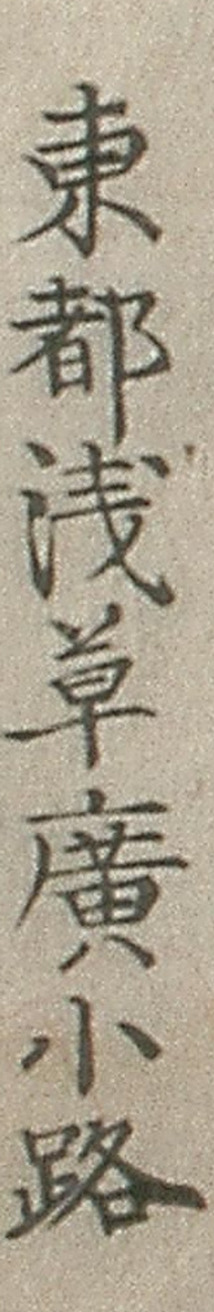東都浅草廣小路
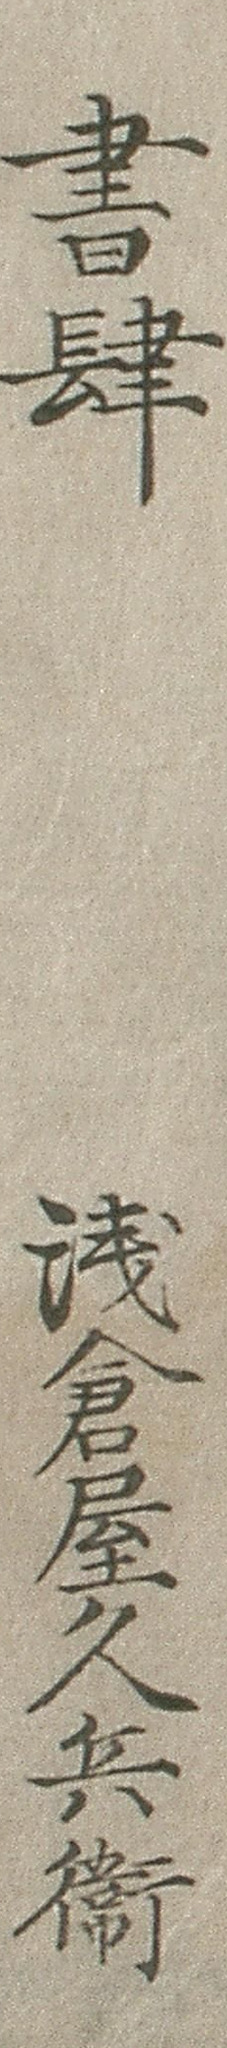書肆浅倉屋久兵衛
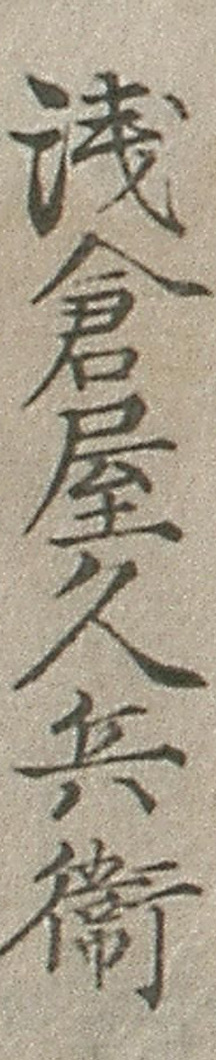朝倉屋久兵衛
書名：附録　地震劇風災害豫防法圖説（内題）
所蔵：東京大学地震研究所図書室 Earthquake Research Institute Library, The University of Tokyo, JAPAN
